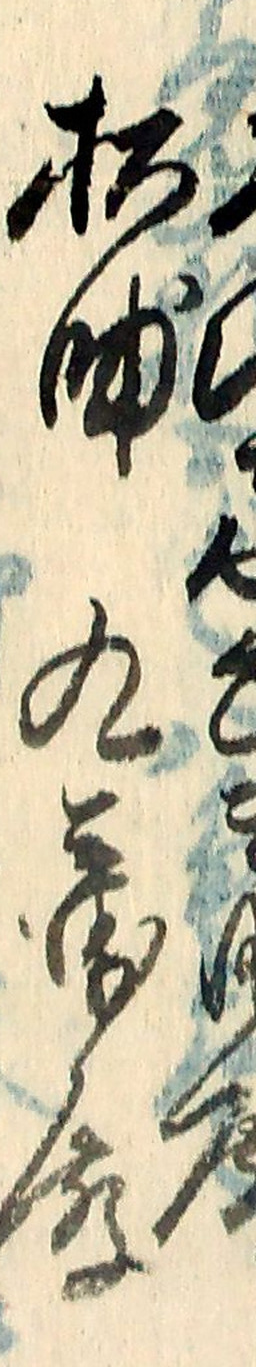松浦九兵衛殿
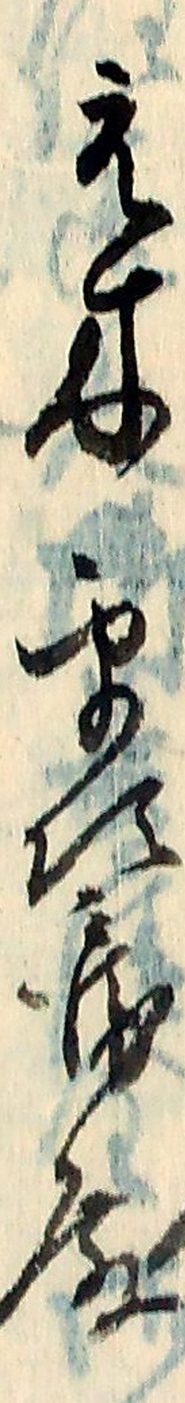元木平次兵衛殿

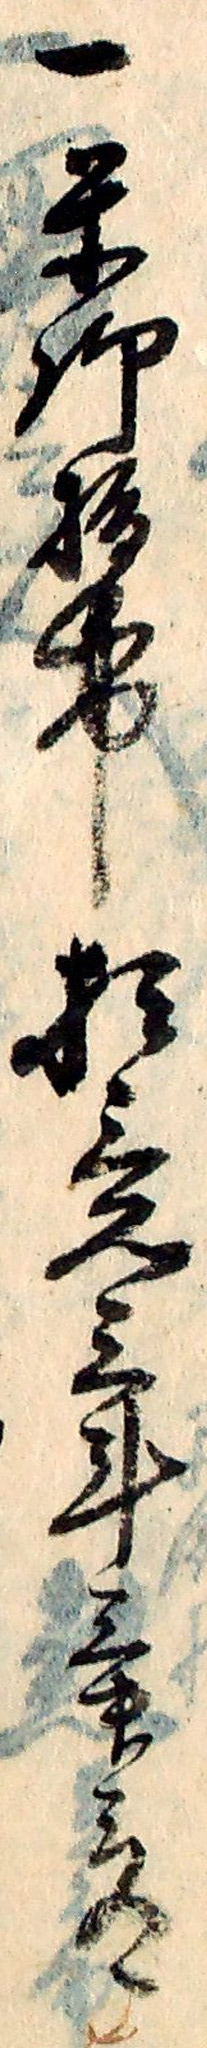一米御指出し拾三石三斗三升三合
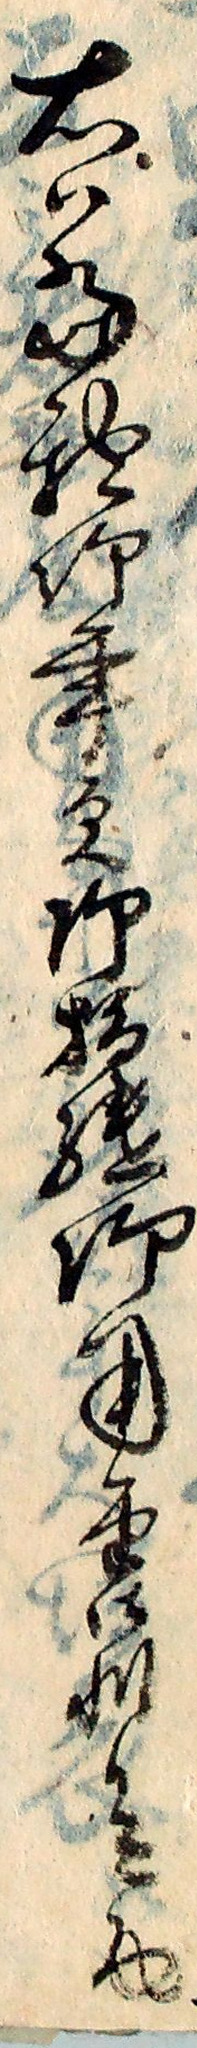右は当秋御年貢御指継御用金御利足内へ
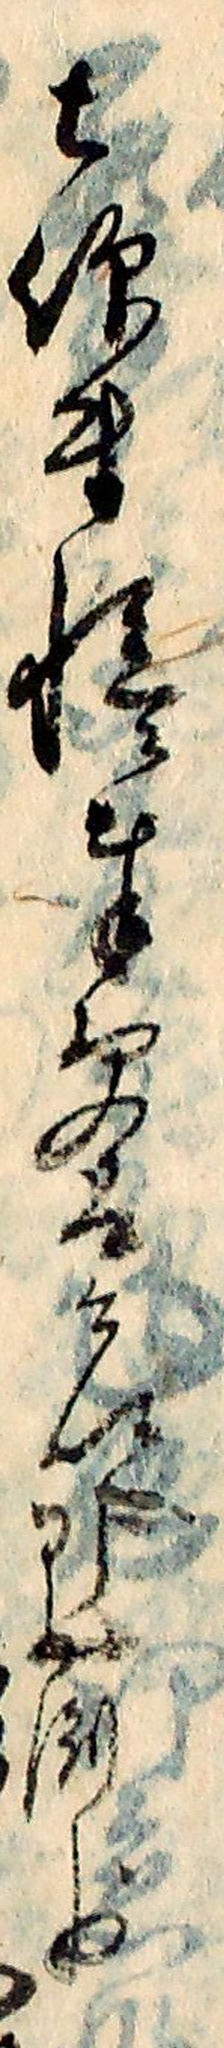被仰付慥に奉受取候以上
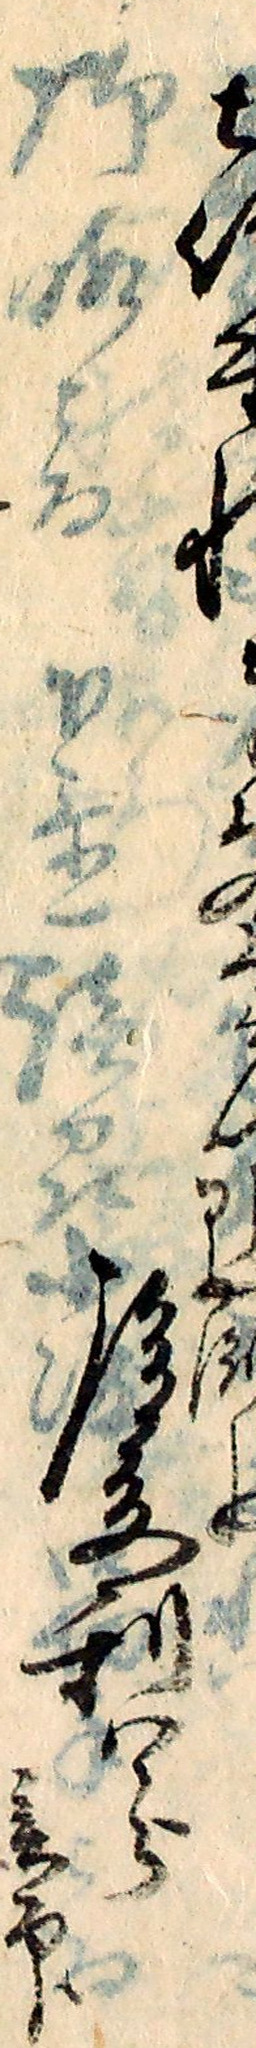後藤利八郎
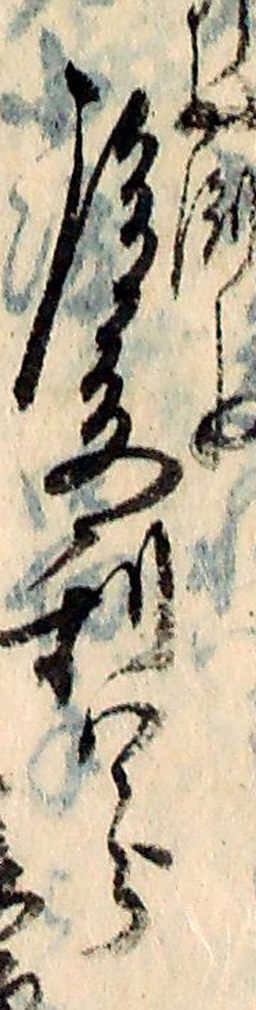後藤利八郎
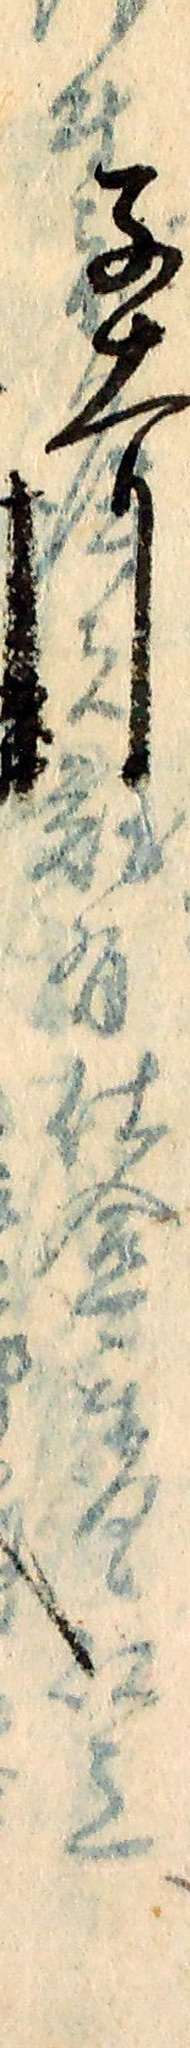子十一月
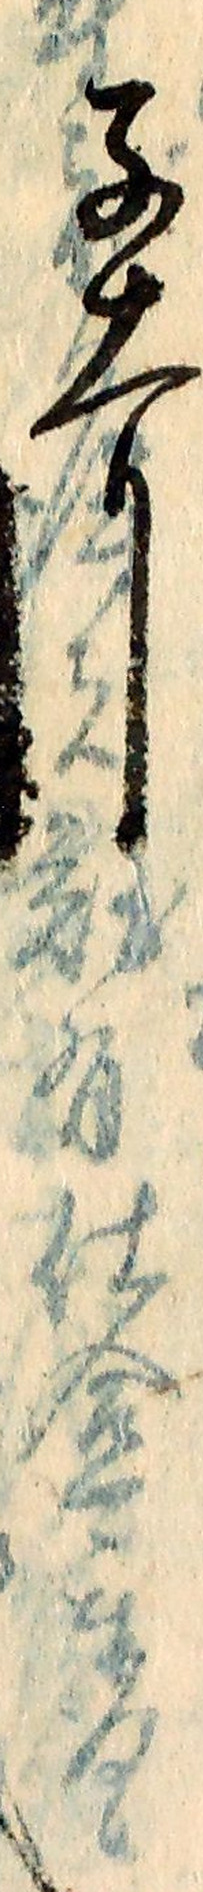子十一月
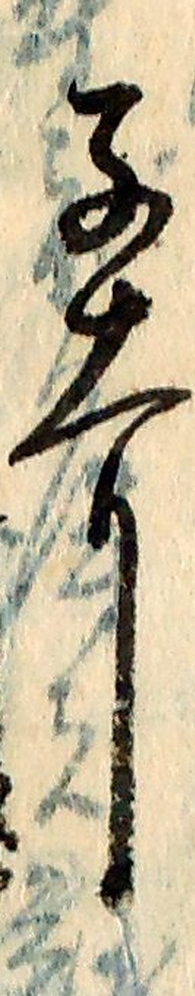子十一月
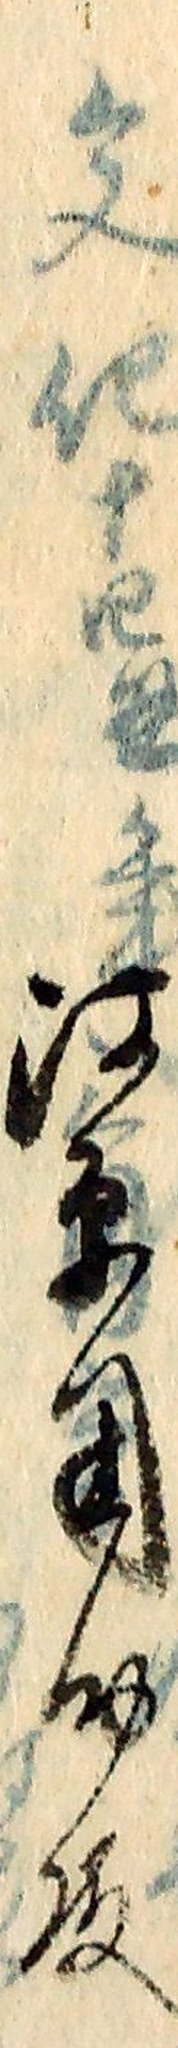河原周助殿
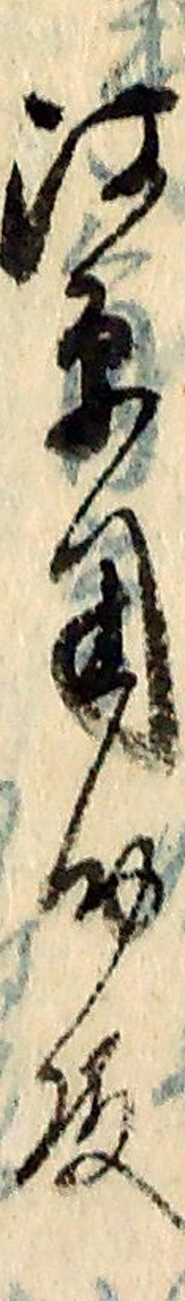河原周助殿
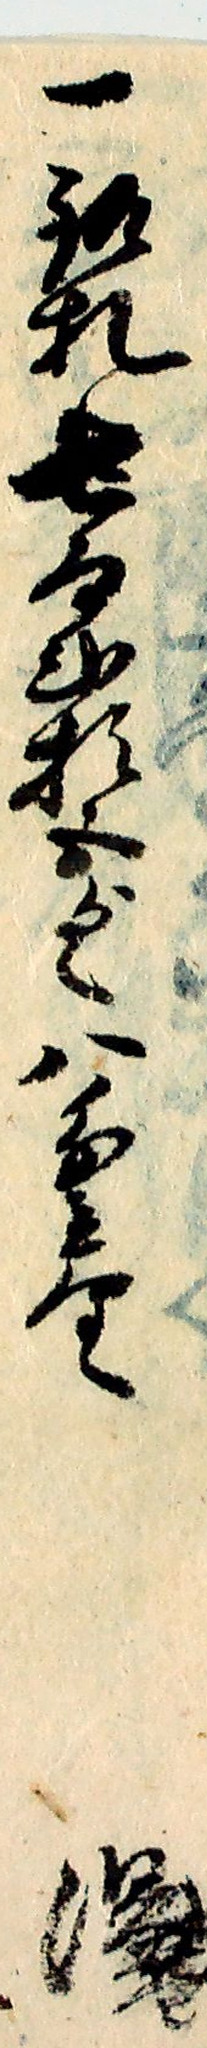一銀札七百弐拾五匁八分壱厘
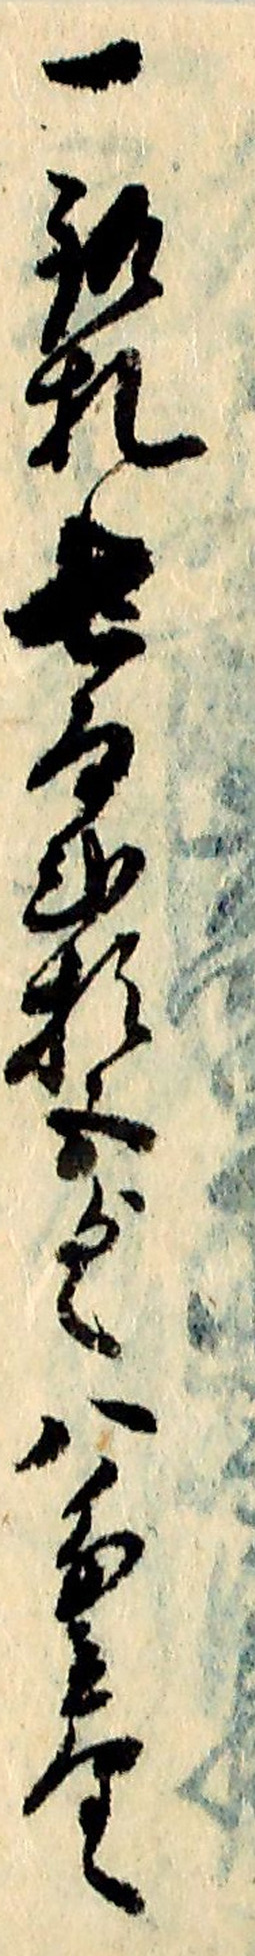一銀札七百弐拾五匁八分壱厘
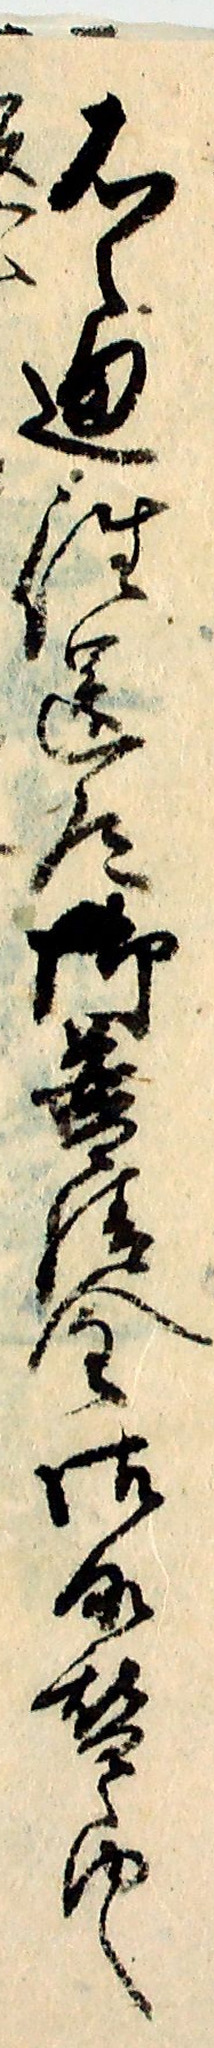右之通往還道御普請金御取替之内へ
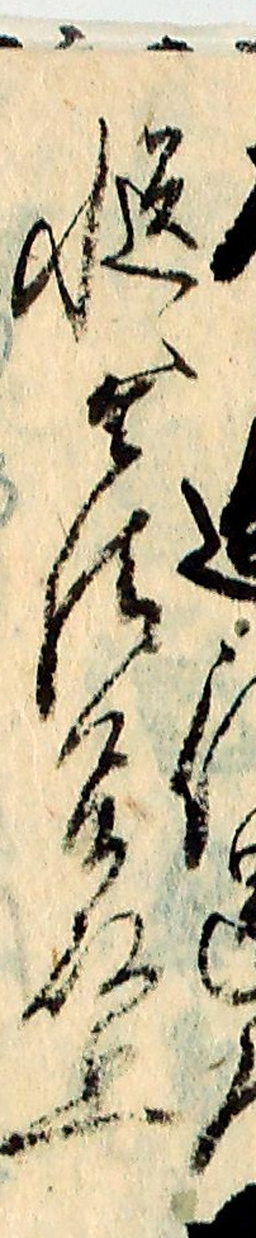慥に奉請取候以上
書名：諸御願書控(後藤氏壱番）
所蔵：鳴門教育大学 Naruto University of Education
